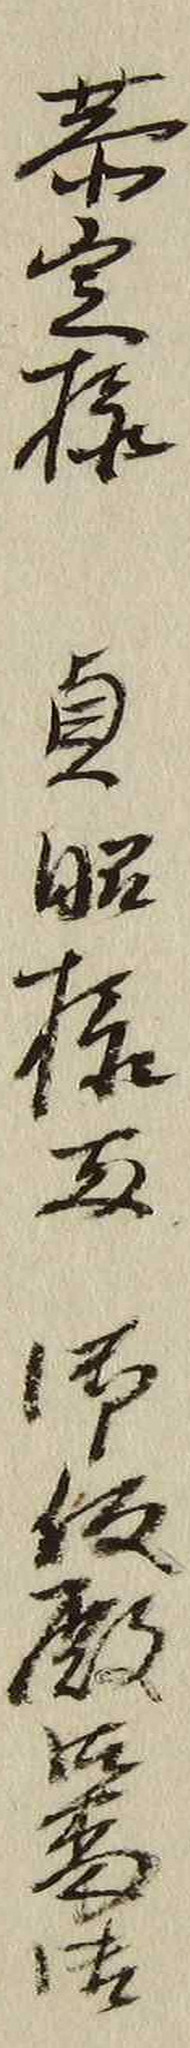恭定様貞昭様両御仮殿御番御
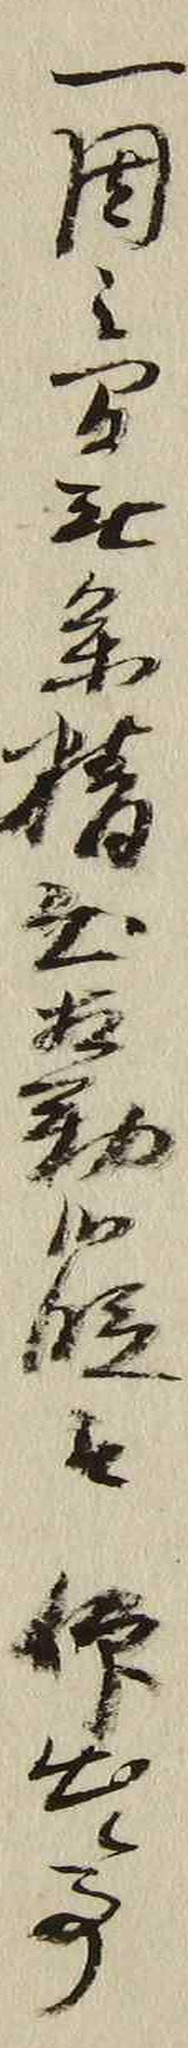一周之間無参精出相勤候段被仰出候事
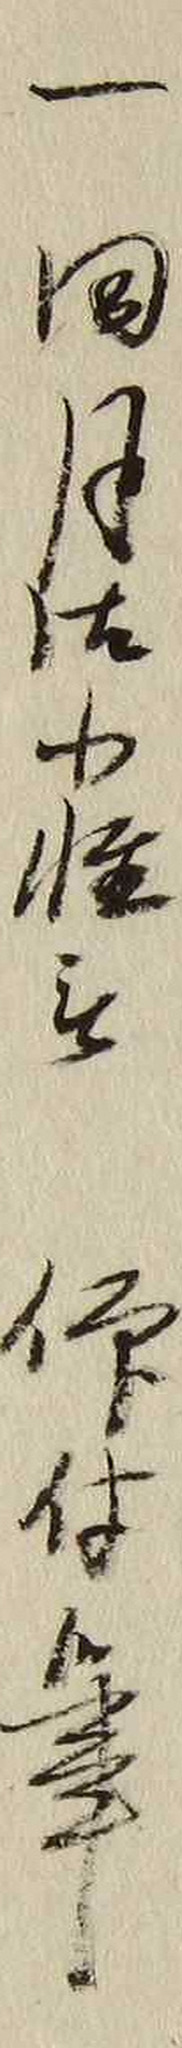一同月御小性被仰付候事
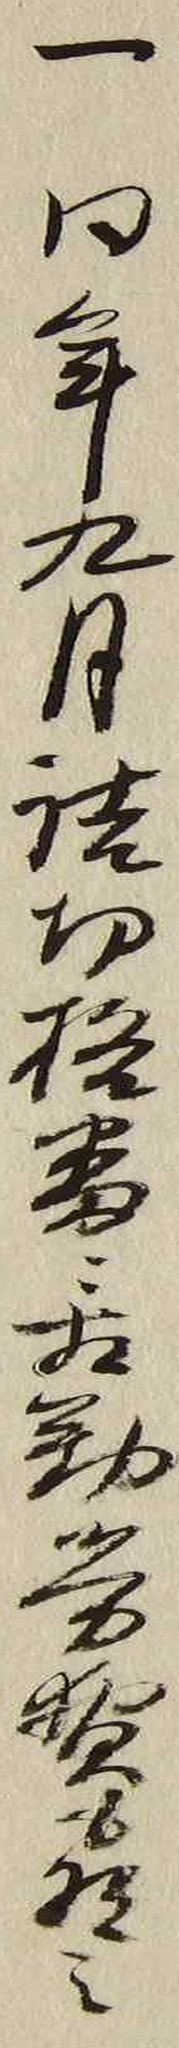一同年九月詰切格番ニ相勤労費も有之
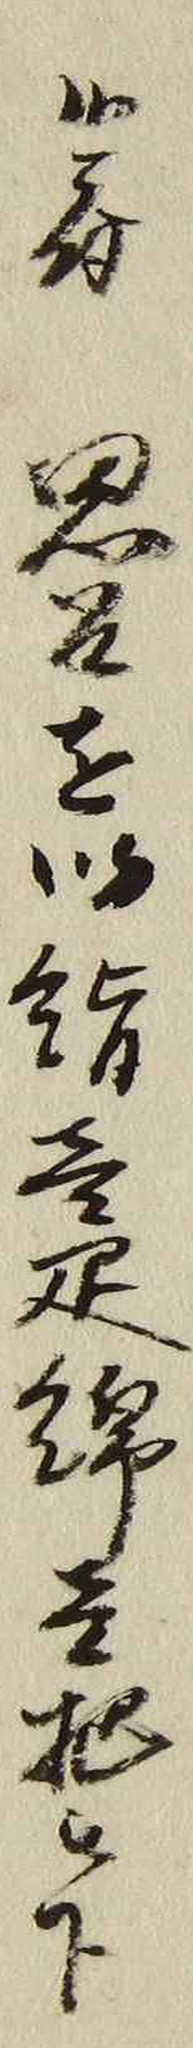候ニ付思召を以絹壱疋綿壱把被下

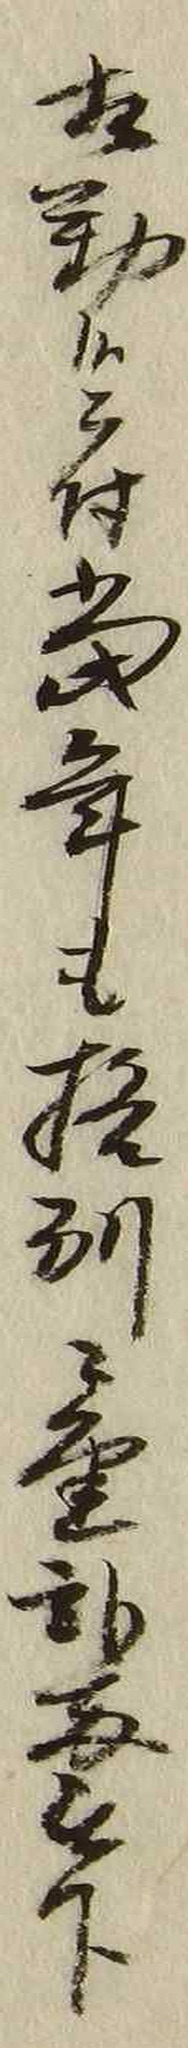相勤候ニ付当年も格別ニ金弐両被下
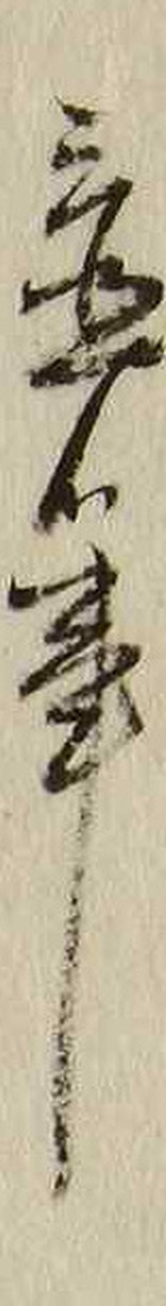置候事
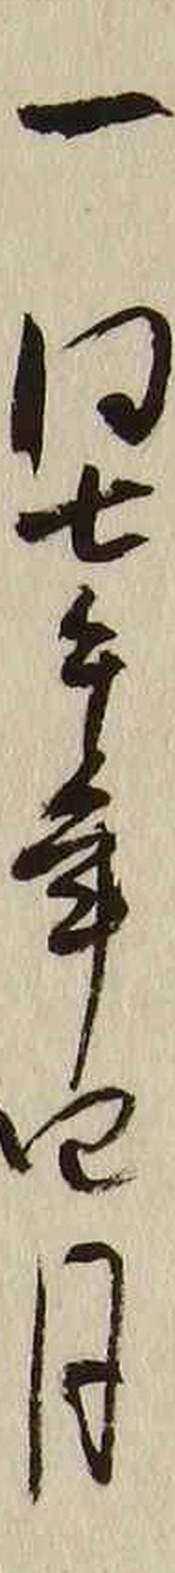一同七午年四月
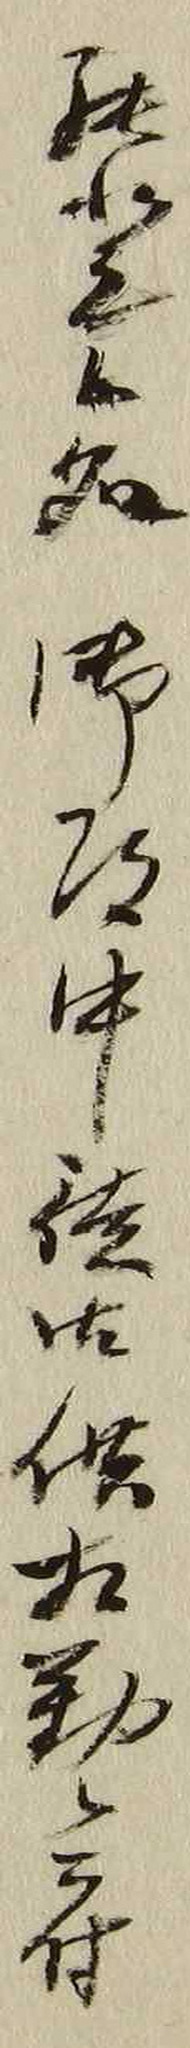罷登候処御道中徒御供相勤候ニ付
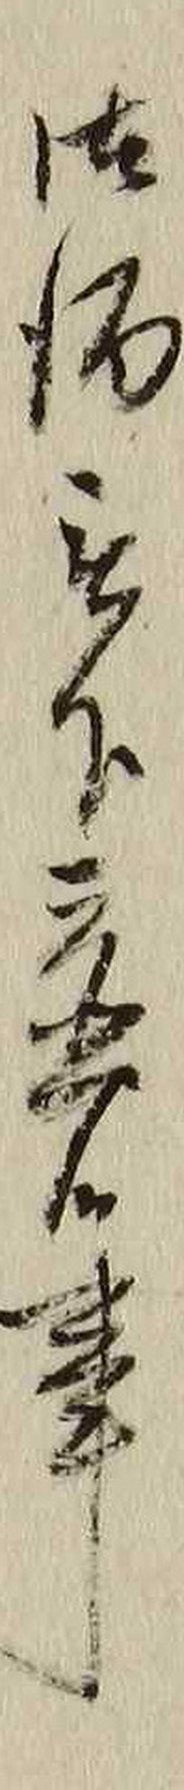御酒被下置候事
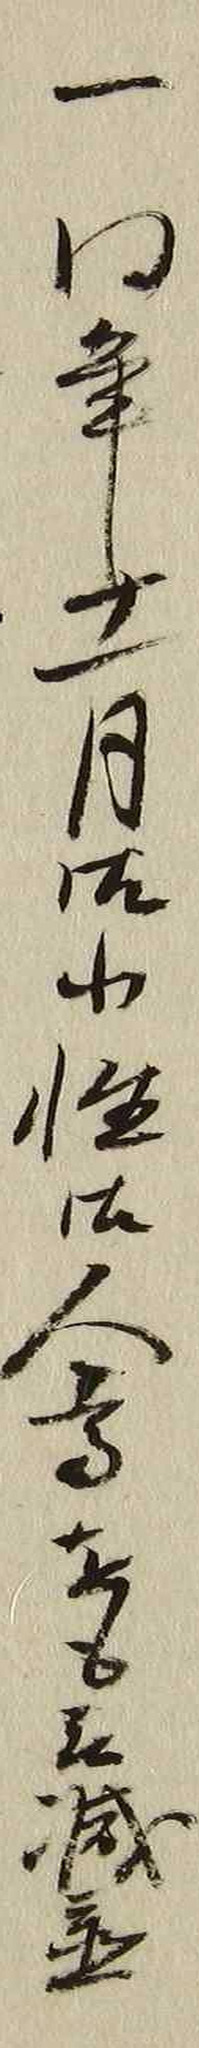一同年十一月御小性御人高をも被減置
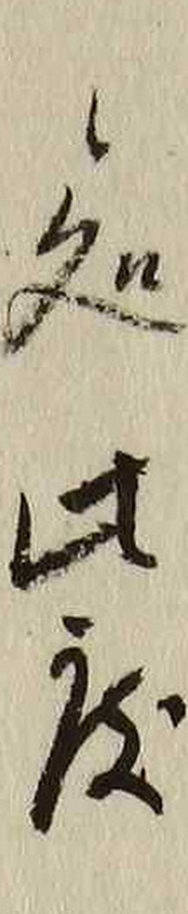候処此度
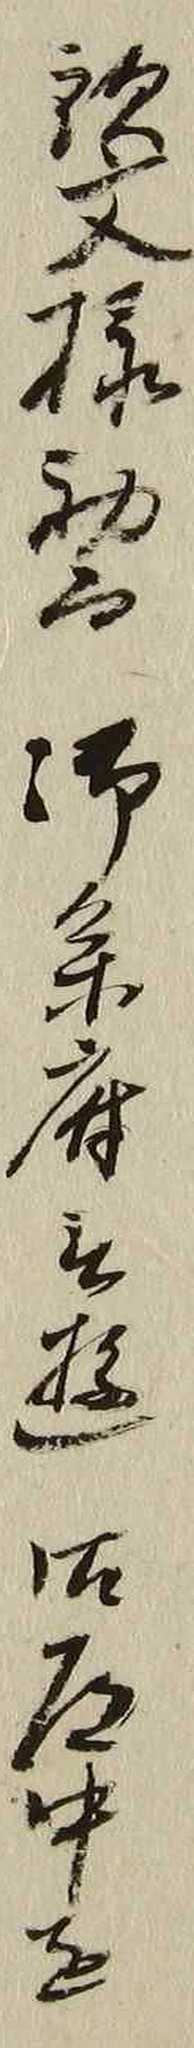欽文様初而御参府被遊御道中を
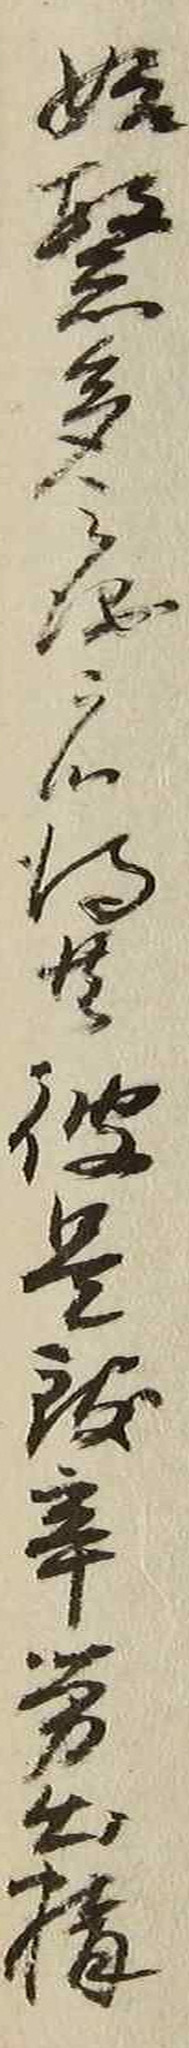始繁多之儀ニ候得共彼是致辛労出精
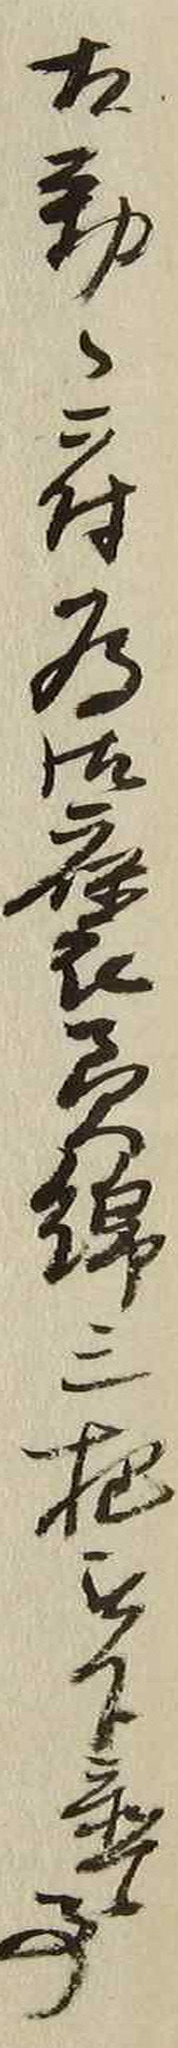相勤候ニ付為御褒美綿三把被下置候事
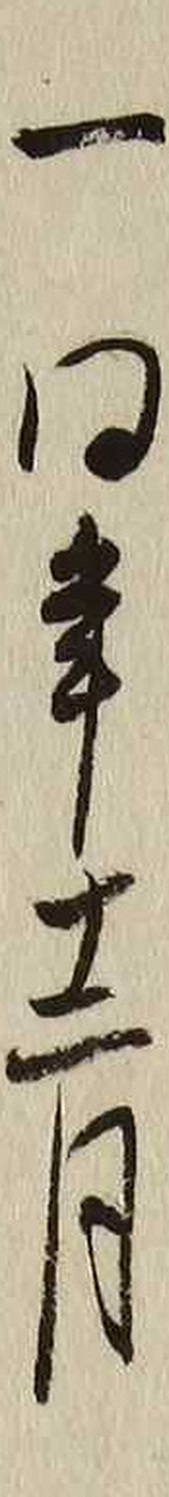一同年十二月
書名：諸士系譜　巻之345　も之部1
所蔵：会津若松市立会津図書館
